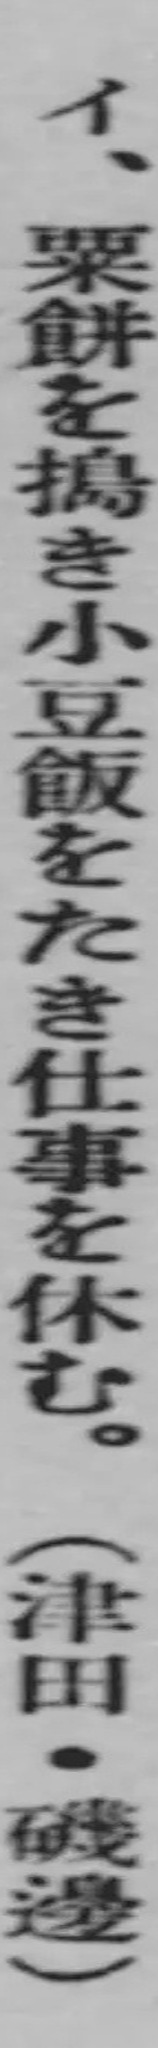イ、粟餅を搗き小豆飯をたき仕事を休む。(津田・磯邊)
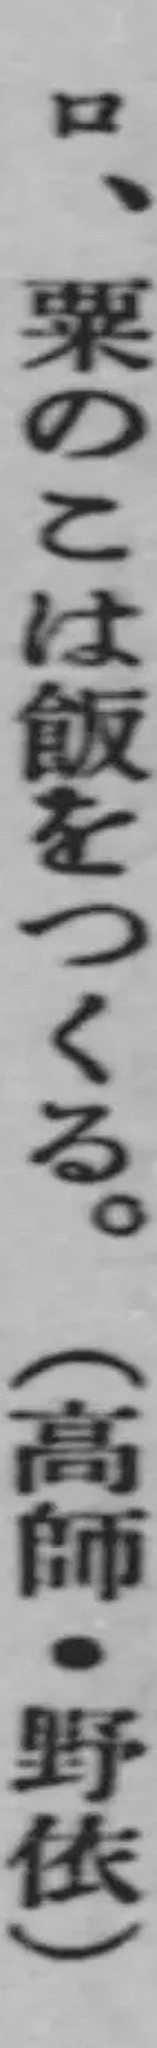ロ、粟のこは飯をつくる。(高師・野依)
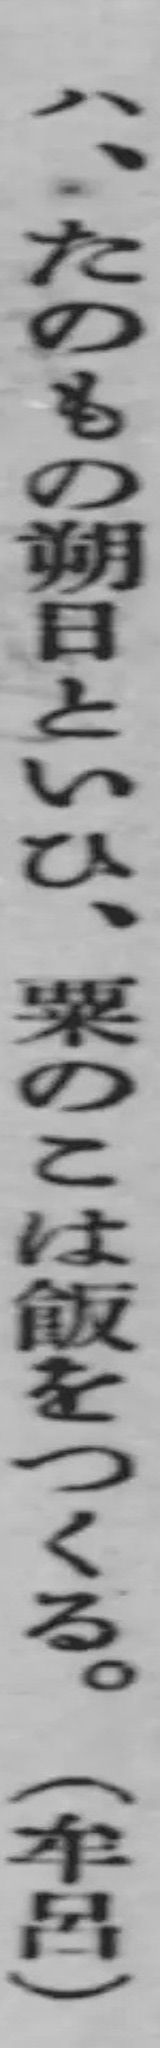ハ、たのもの朔日といひ、粟のこは飯をつくる。(牟呂)
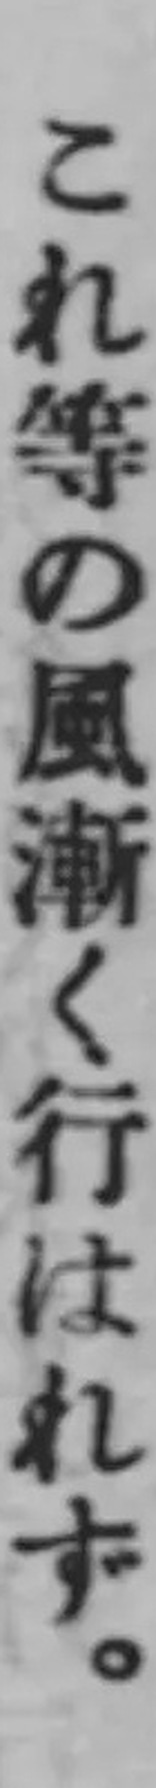これ等の風漸く行はれず。
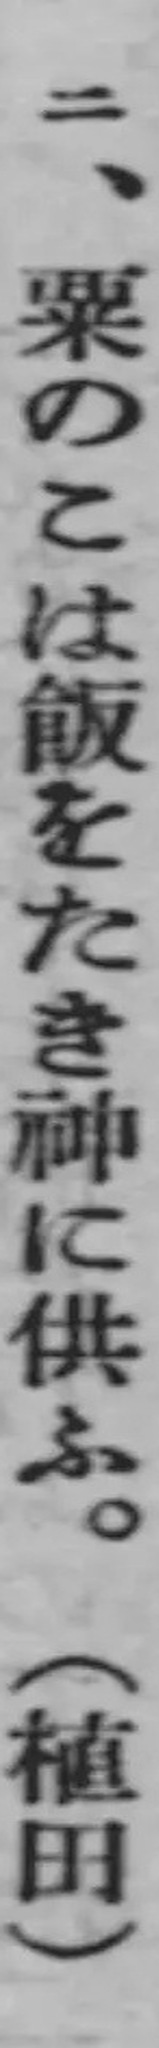ニ、粟のこは飯をたき神に供ふ。(植田)
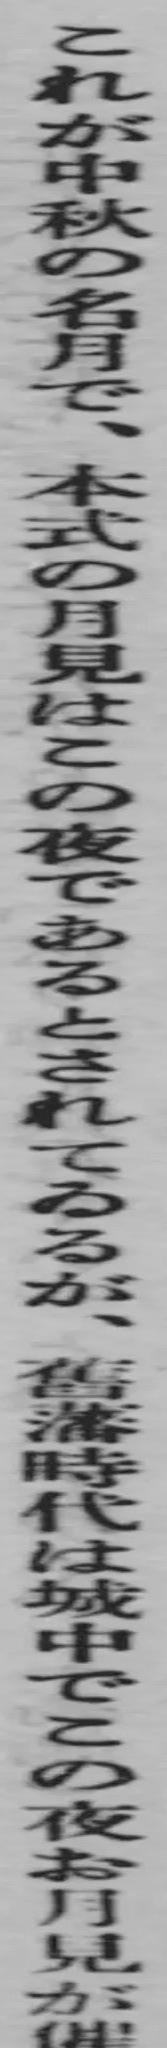これが中秋の名月で、本式の月見はこの夜であるとされてゐるが、舊藩時代は城中でこの夜お月見が催
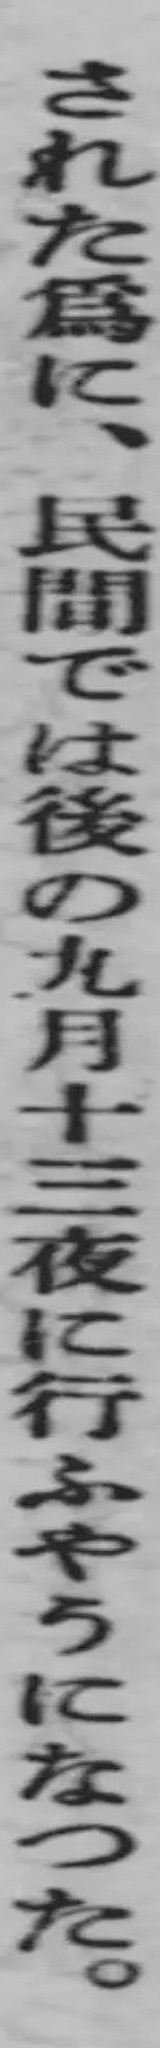された爲に、民間では後の九月十三夜に行ふやうになつた。
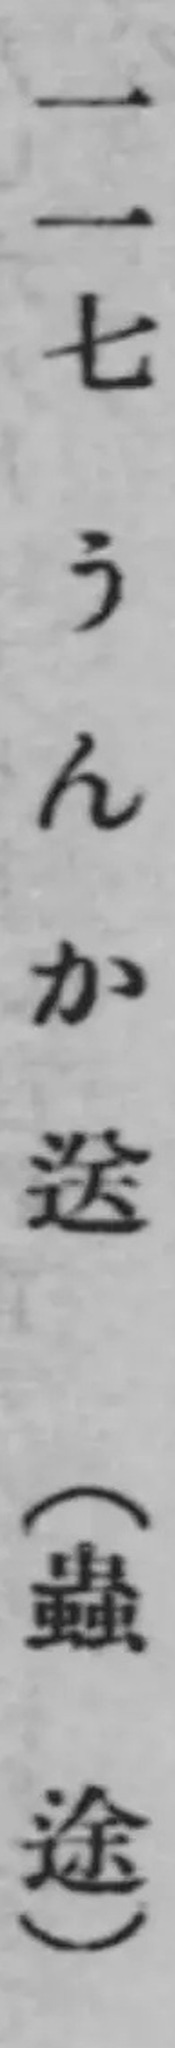一一七うんか送(蟲途)

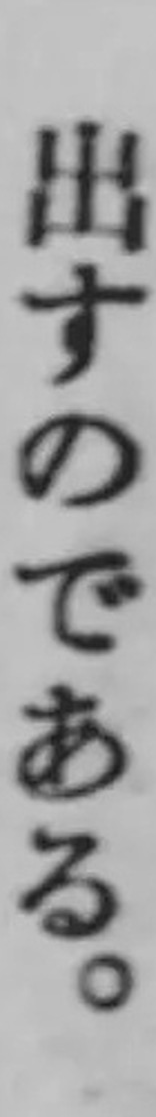出すのである。
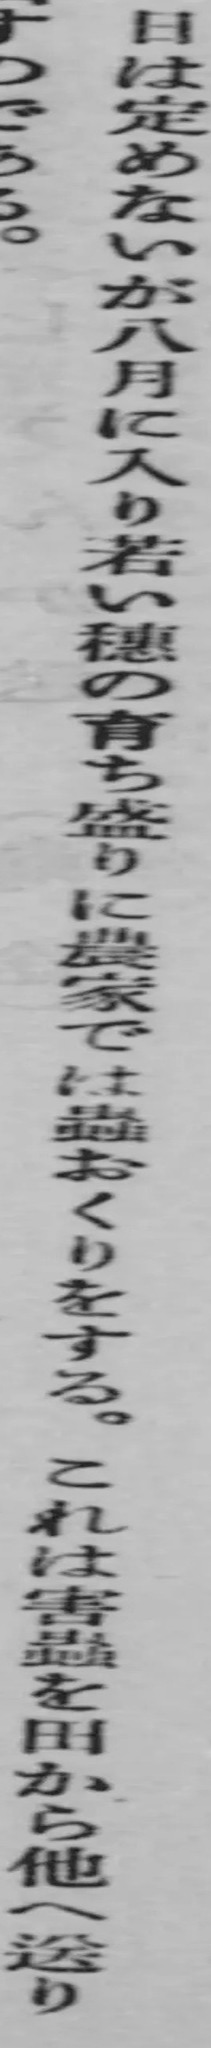日は定めないが八月に入り若い穗の育ち盛りに農家では蟲おくりをする。これは害蟲を田から他へ送り
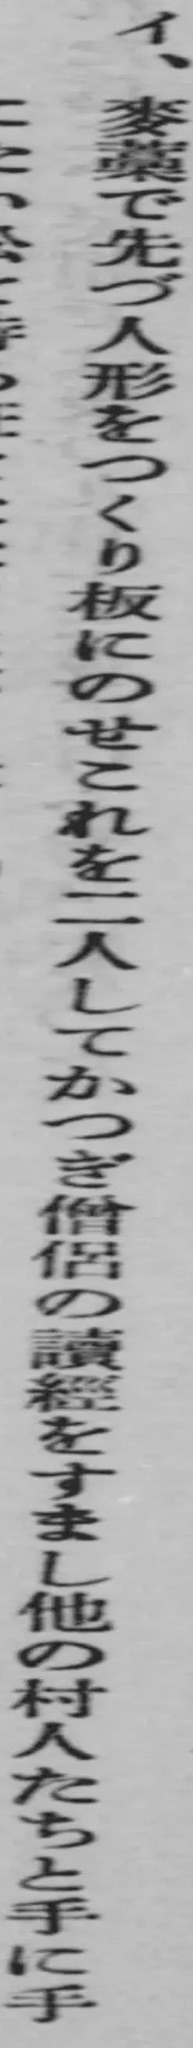イ、麥藁で先づ人形をつくり板にのせこれを二人してかつぎ僧侶の讀經をすまし他の村人たちと手に手
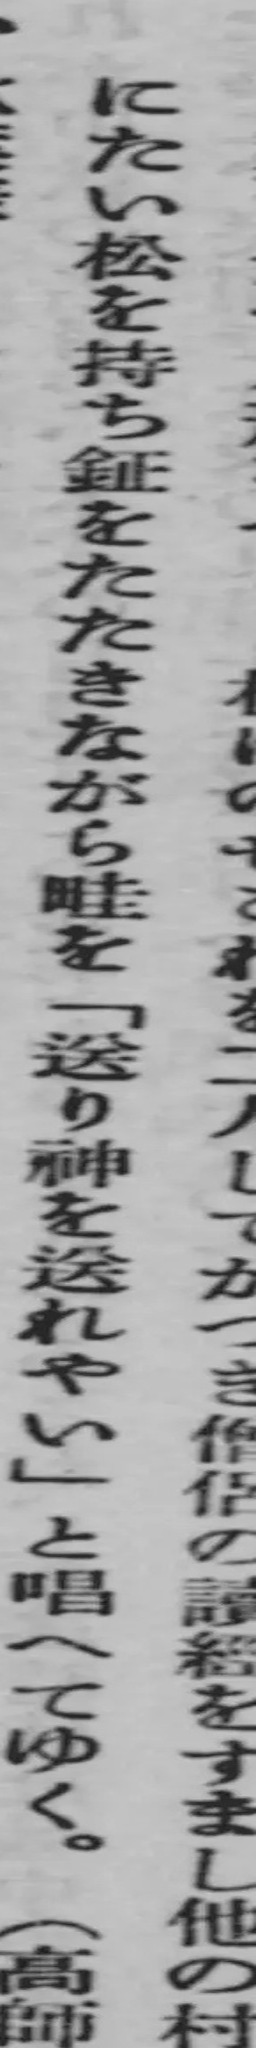にたい松を持ち鉦をたたきながら畦を「送り神を送れやい」と唱へてゆく。(高師)
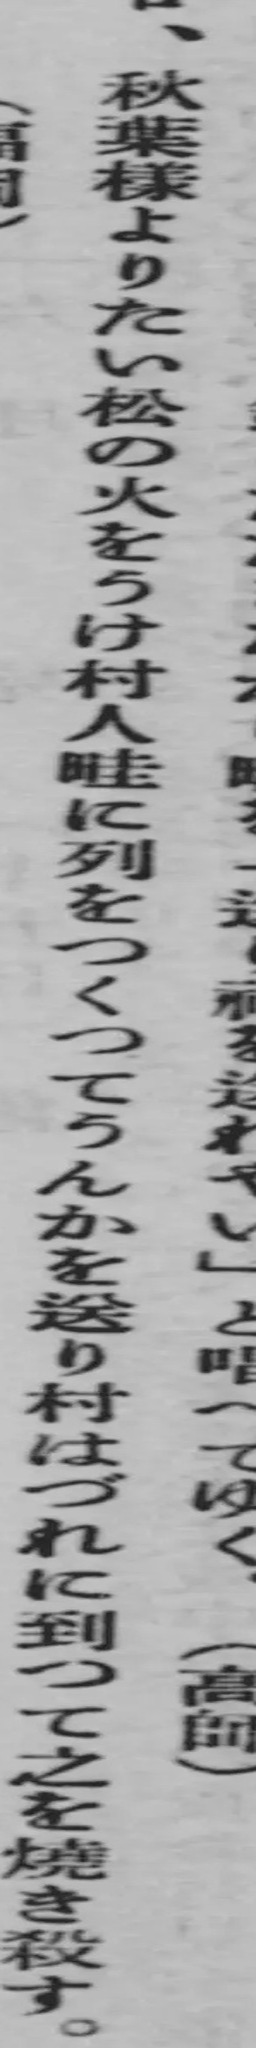ロ、秋葉様よりたい松の火をうけ村人畦に列をつくつてうんかを送り村はづれに到つて之を燒き殺す。
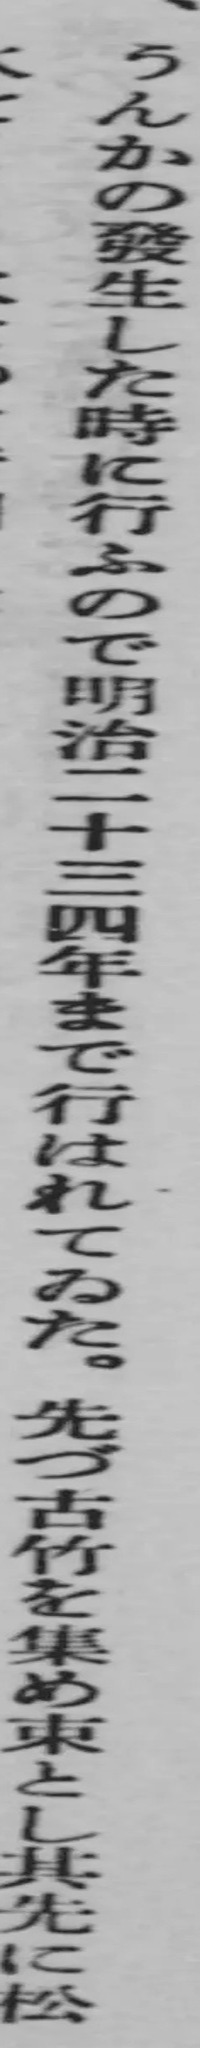ハ、うんかの發生した時に行ふので明治二十三四年まで行はれてゐた。先づ古竹を集め束とし其先に松
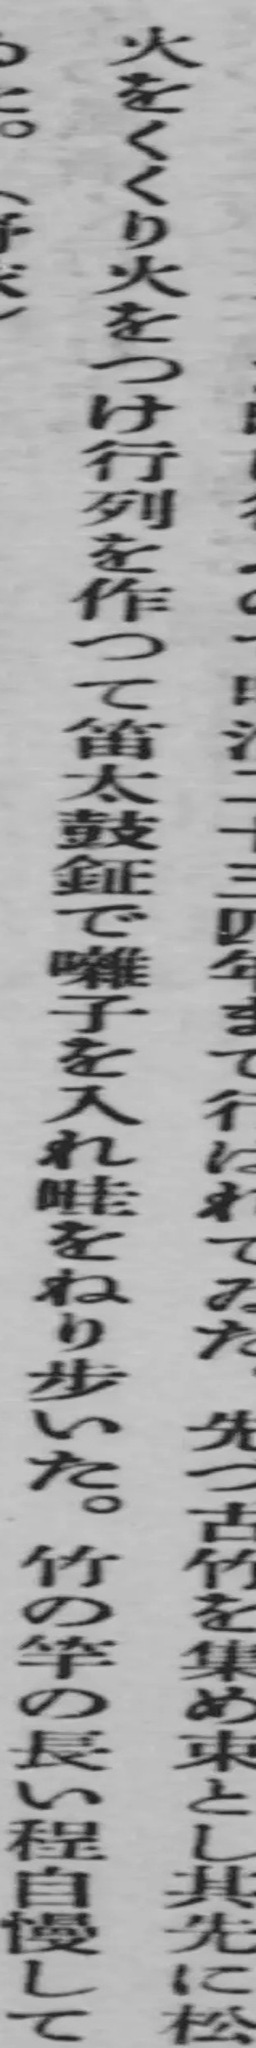火をくくり火をつけ行列を作つて笛太鼓鉦で囃子を入れ畦をねり歩いた。竹の竿の長い程自慢して
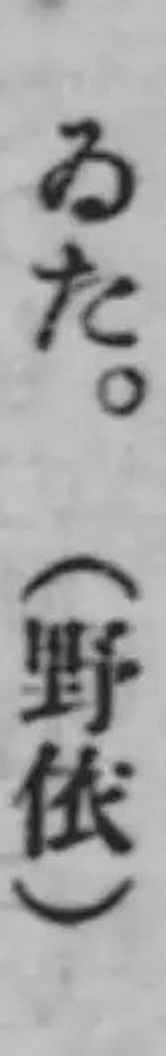ゐた。(野依)
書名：豊橋の年中行事
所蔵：国立国会図書館 National Diet Library, JAPAN
